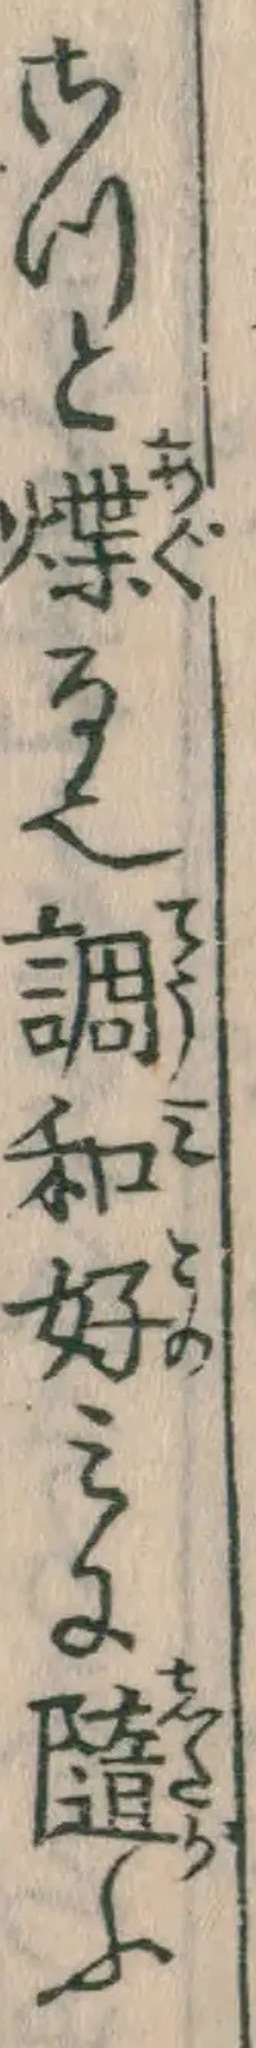さつと煠る也調和好みに随ふ

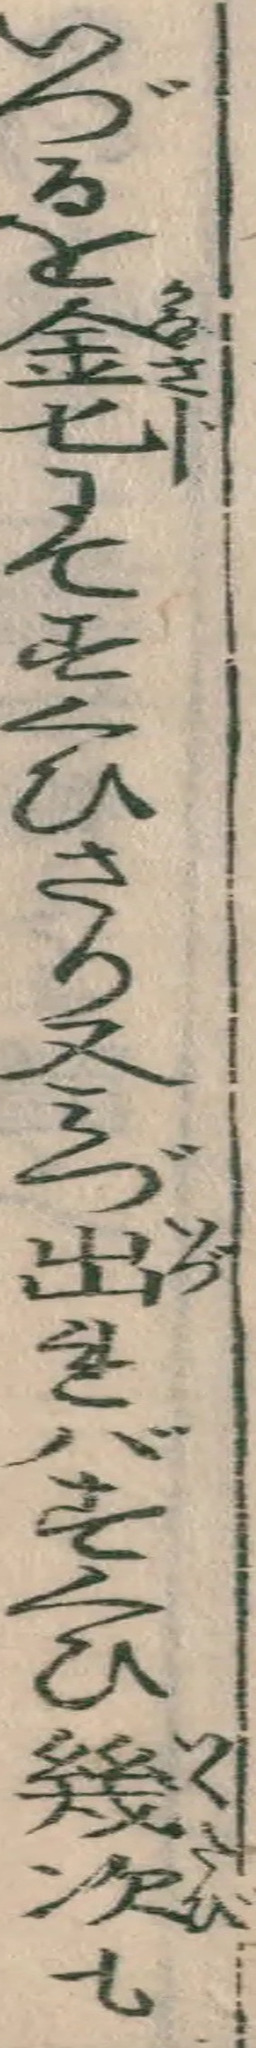いづるを金匕にてすくひさり又みづ出ればすくひ幾次も
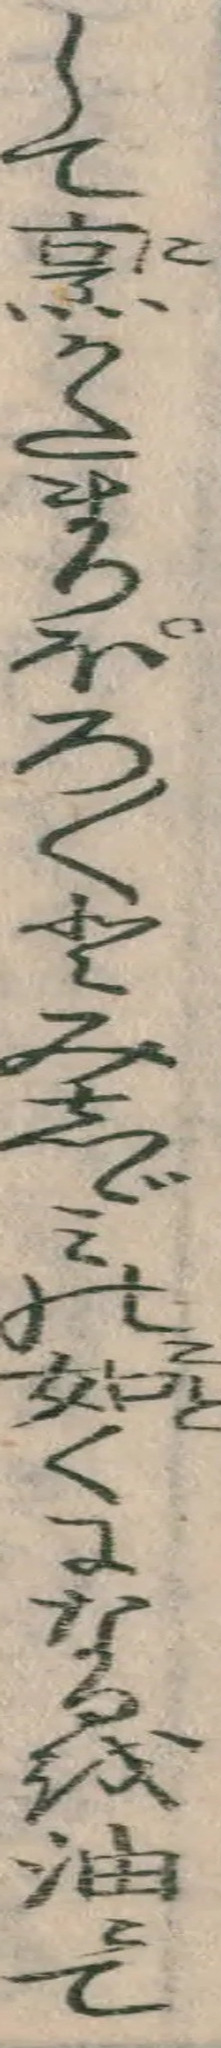して烹かたまりぽろ〳〵とみしゞみの如くになるを油にて
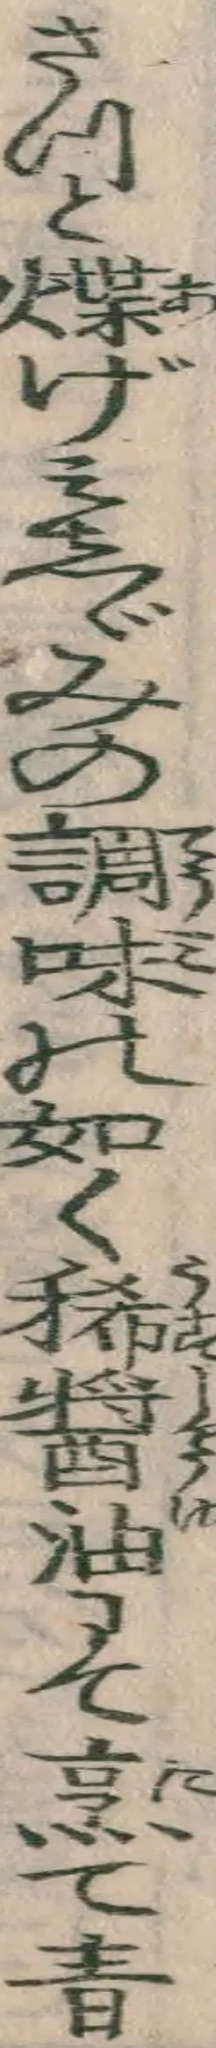さつと煠げてしゞみの調味の如く稀醤油にて烹て青
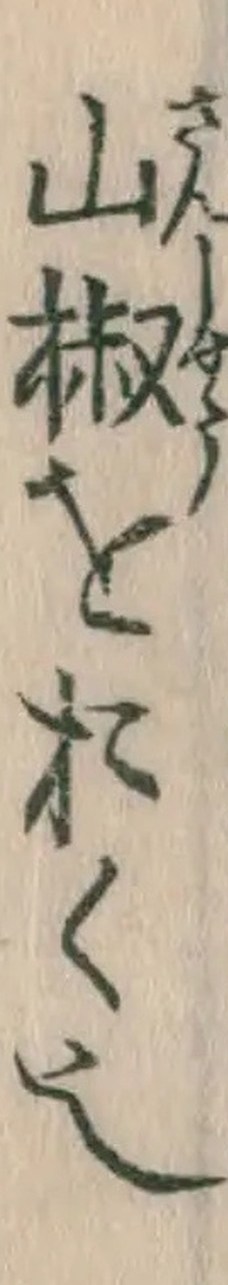山椒をおく也
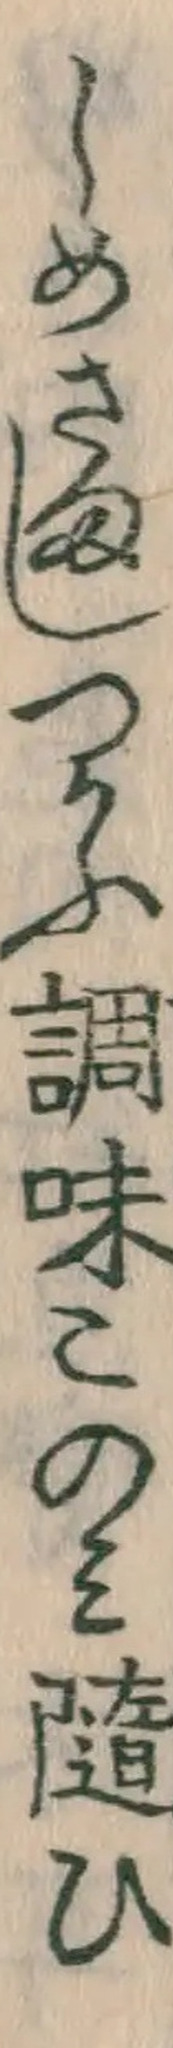しめさましつかふ調味このみ随ひ
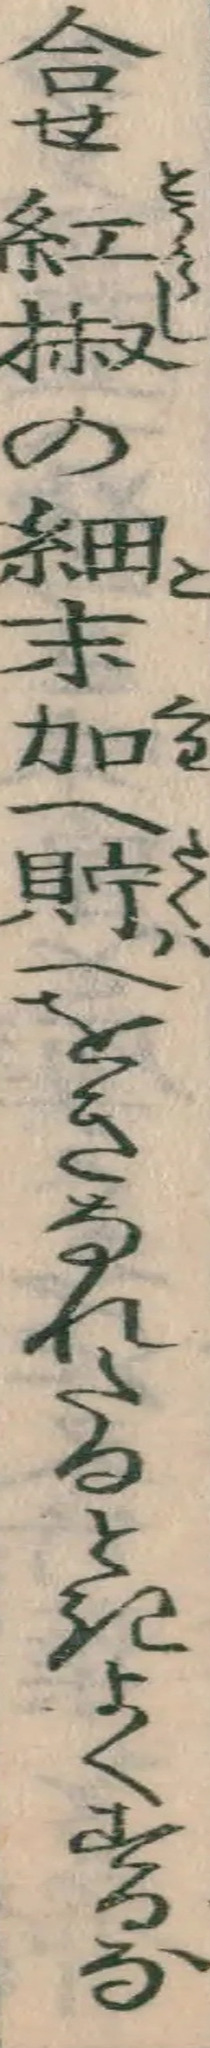合せ紅椒の細末加へ貯へをきなれたるときよくするな
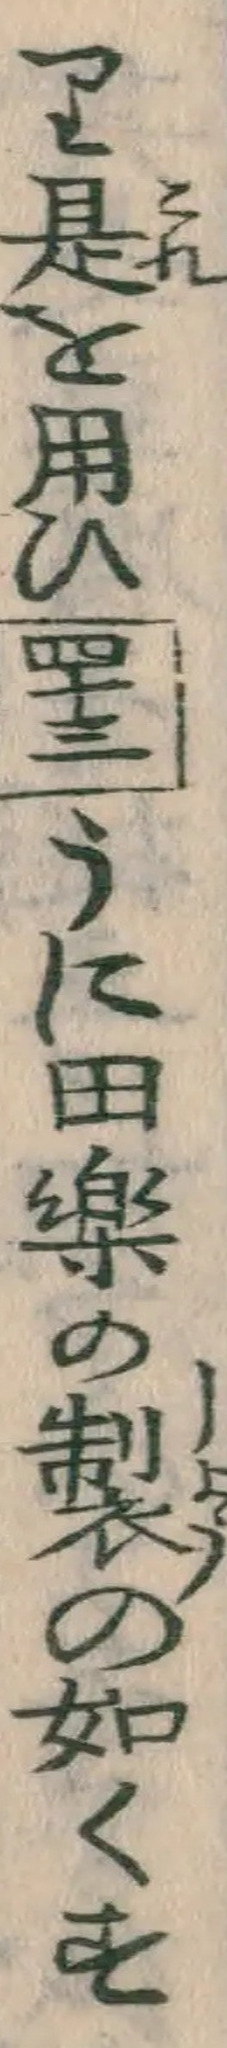り是を用い[四十三]うに田楽の製の如くす
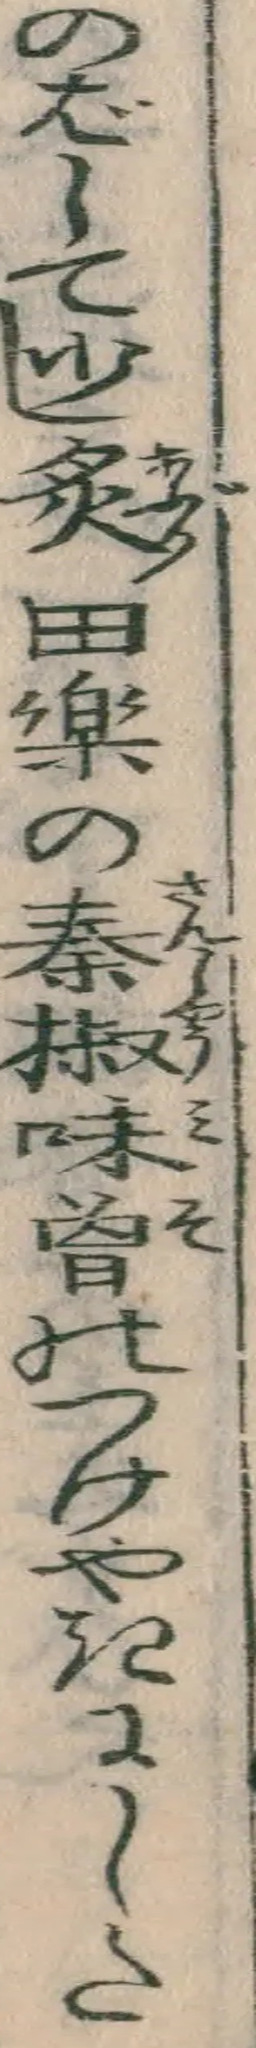のばして少し炙田楽の秦椒味曾のつけやきにした
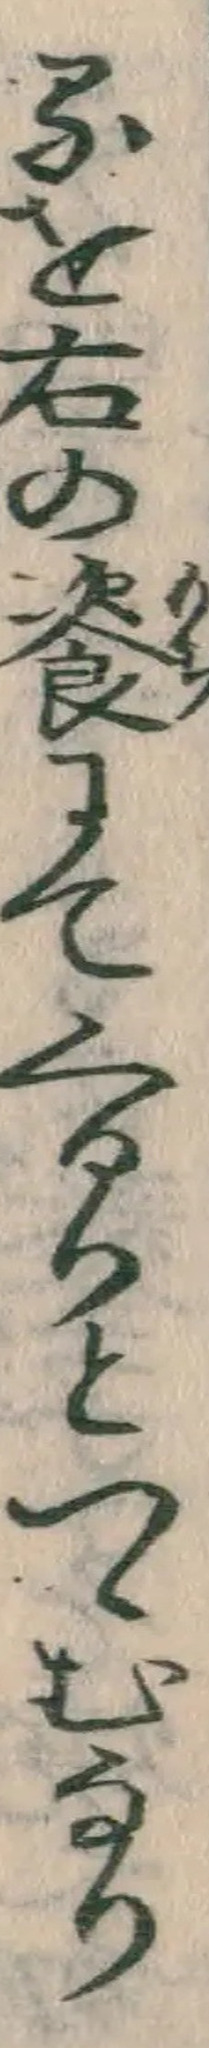るを右の餈にてくるりとつゝむなり
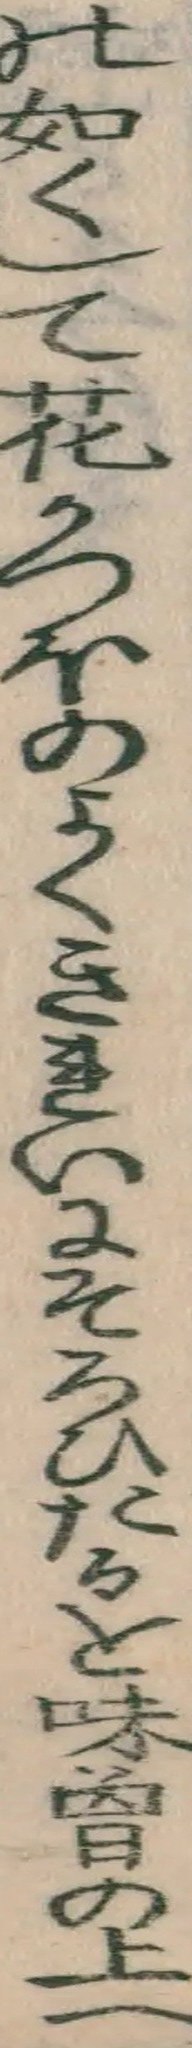の如くして花かつほのよくきれいにそろひたるを味曾の上へ

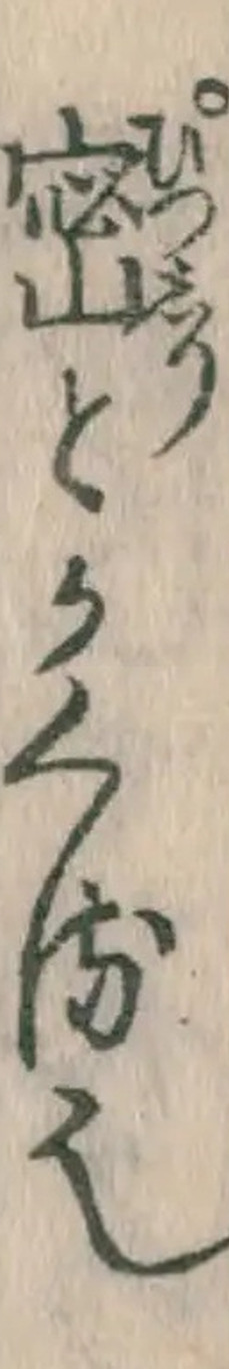密とかくる也
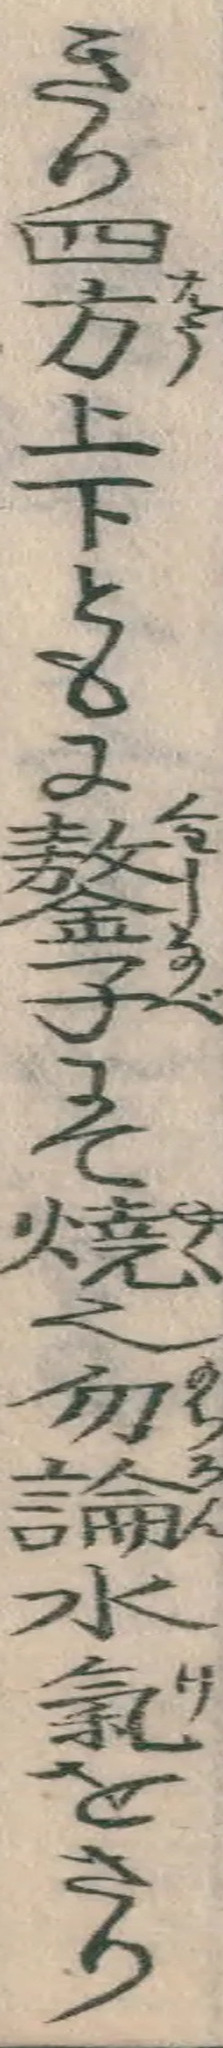きり四方上下ともに鏊子にて焼也勿論水気をさり
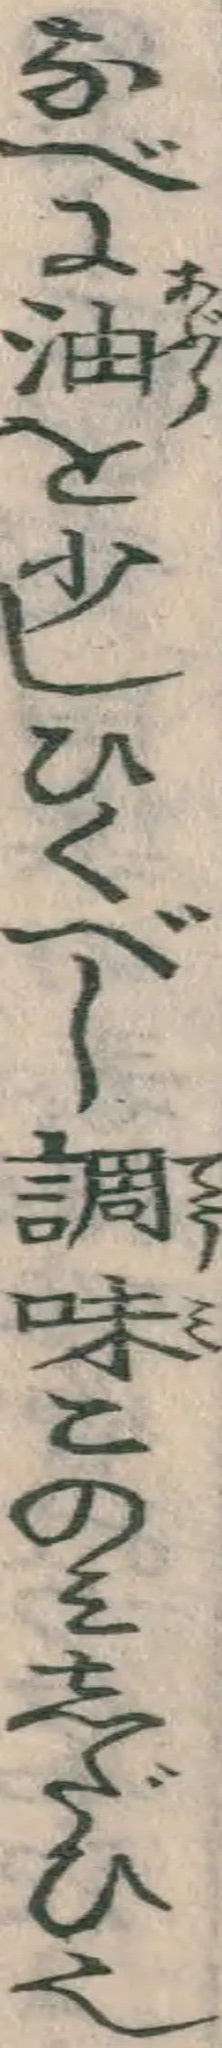なべに油を少しひくべし調味このみしだひ也
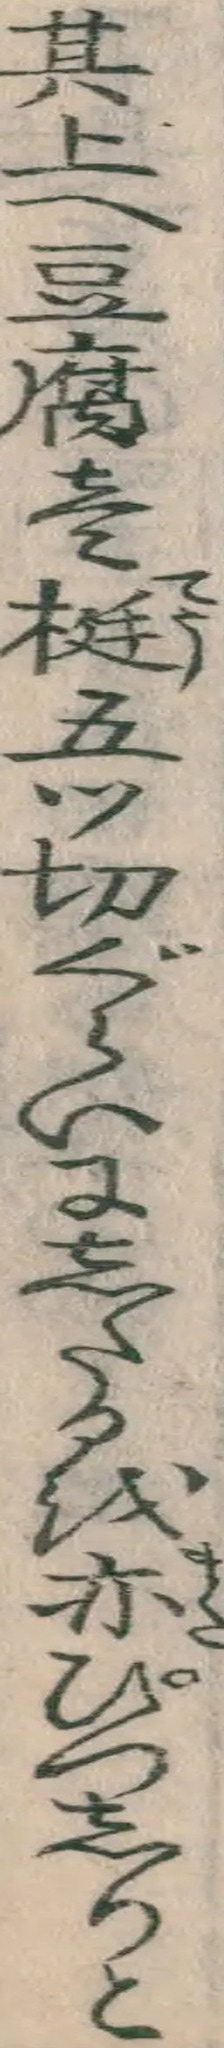其上へ豆腐を壱挺五ッ切ぐらいにしたるを亦ぴつしりと
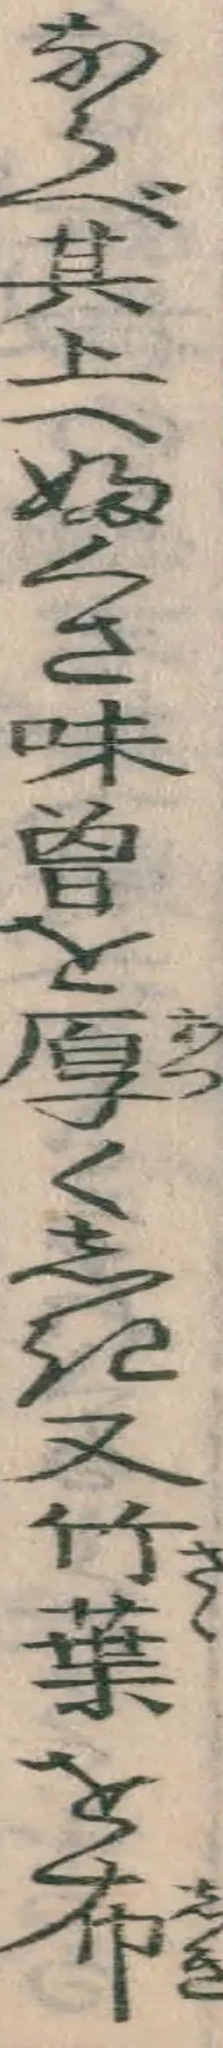ならべ其上へふくさ味曽を厚くしき又竹葉を布
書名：豆腐百珍. [正編]
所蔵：国立国会図書館 National Diet Library, JAPAN
